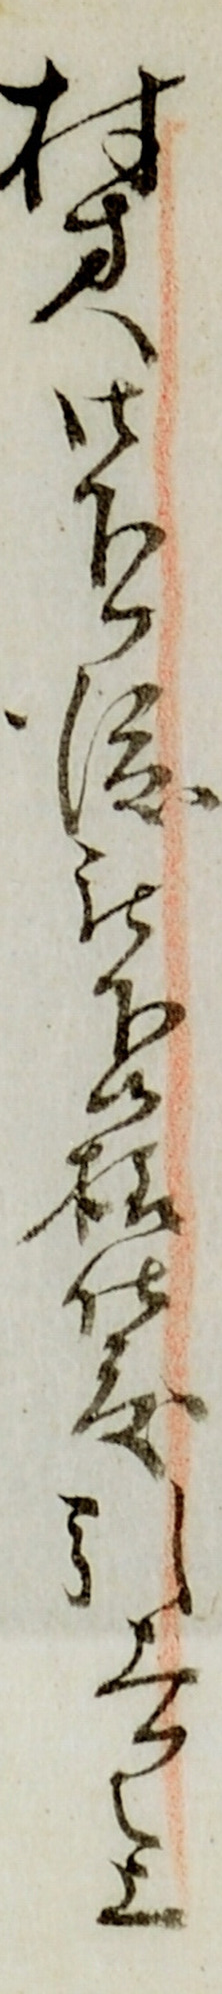村方へ御下ケ渡被下候様仕度引上ケ之上
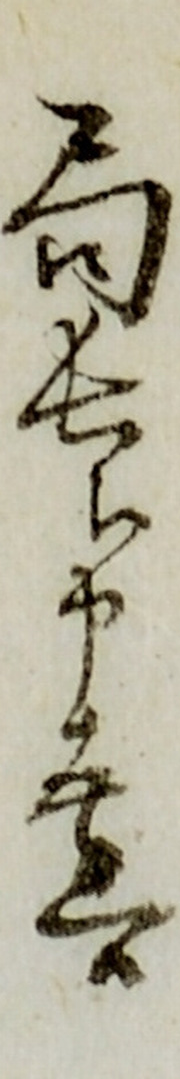局長え申達候
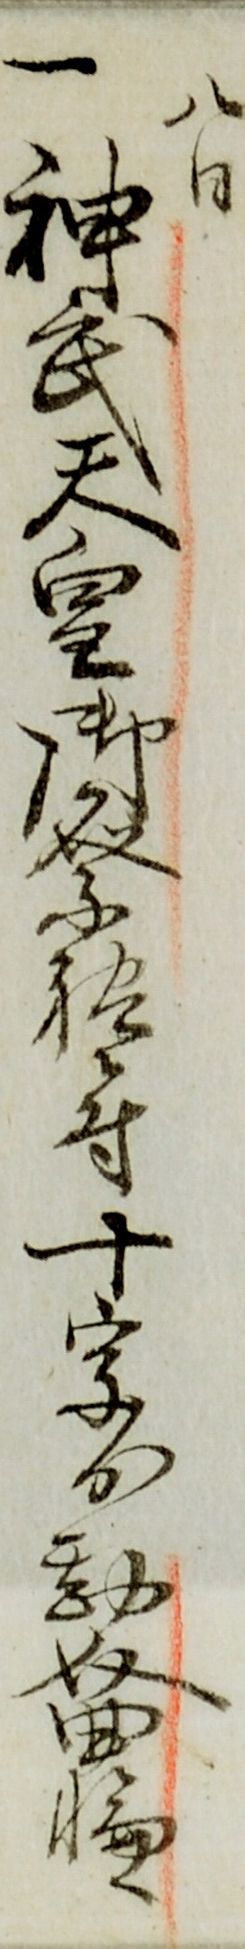一神武天皇御祭礼に付十字ゟ勘介曲輪へ
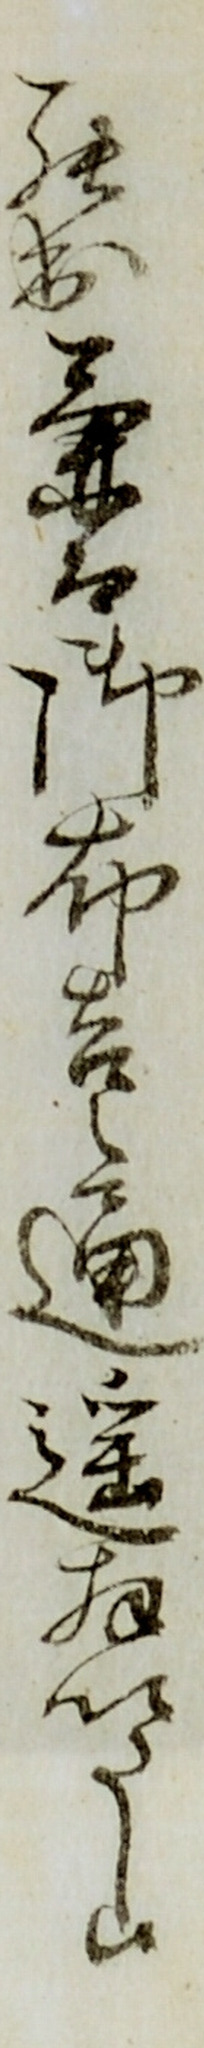罷出兼て御布告之通遥拝いたし候
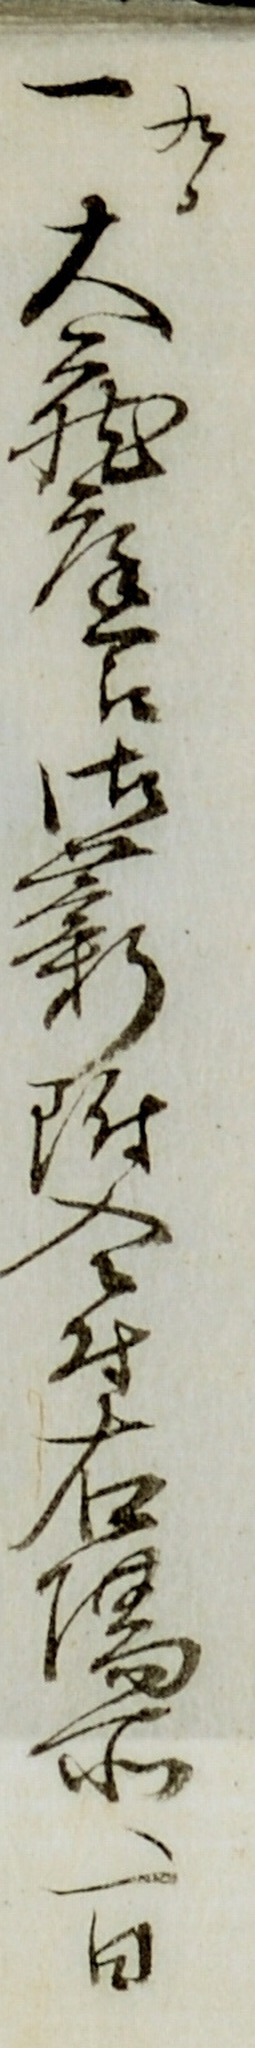一大蔵庭え御薪附入に付右場所へ一日
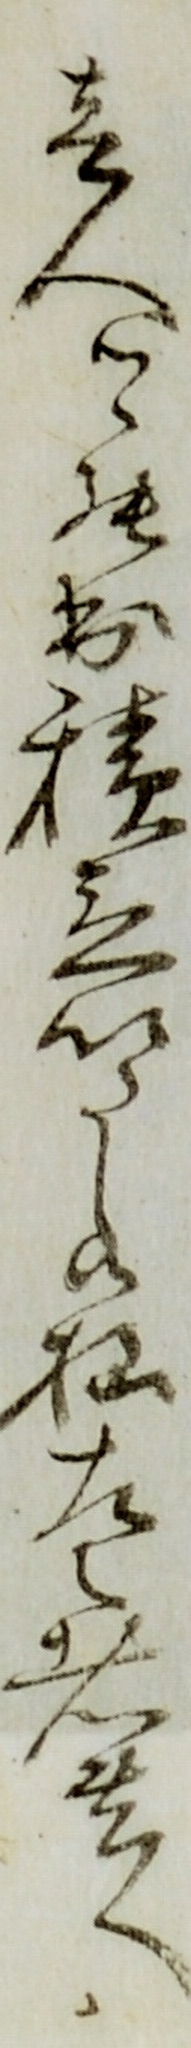壱人ツヽ罷出積立いたし候様左之者共へ
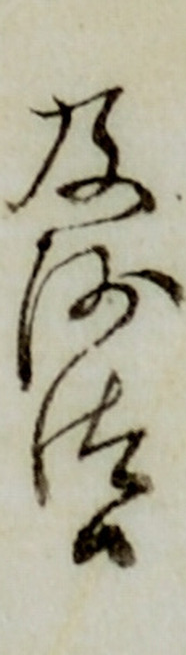及沙汰候
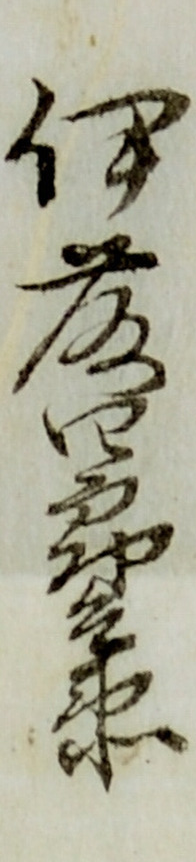伊藤四郎兵衛

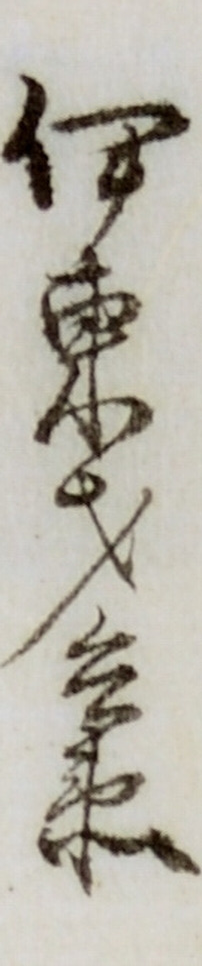伊東才兵衛
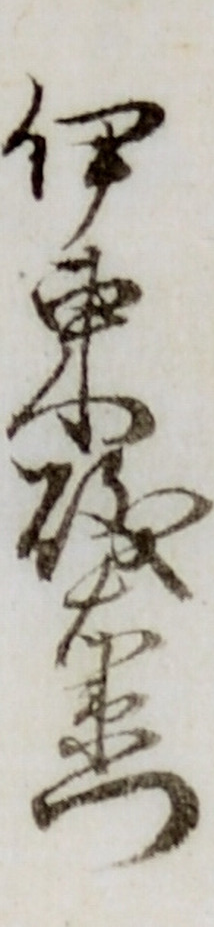伊東礒右衛門
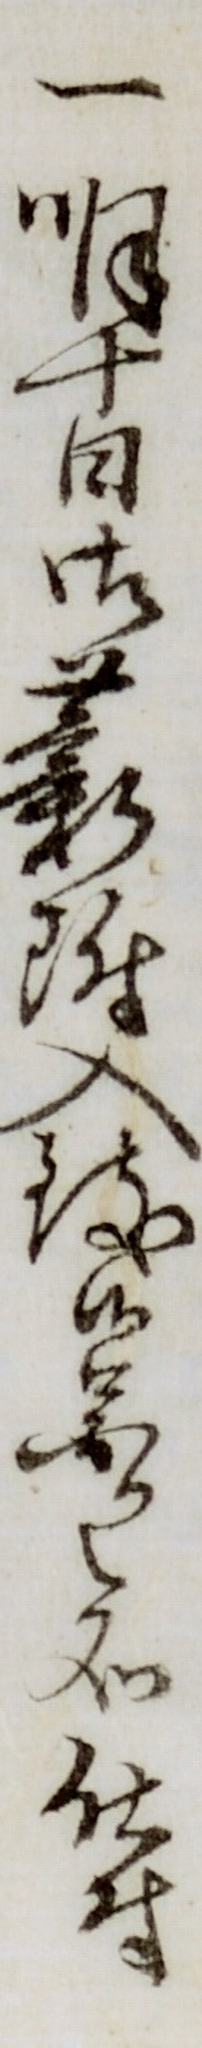一明十日御薪附入致候図り之処仕付
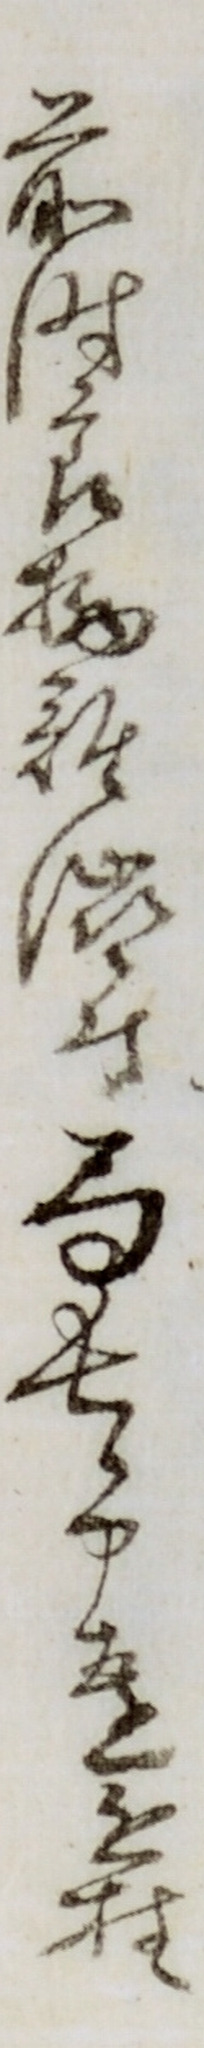前時節柄難渋に付局長へ申達近村へ
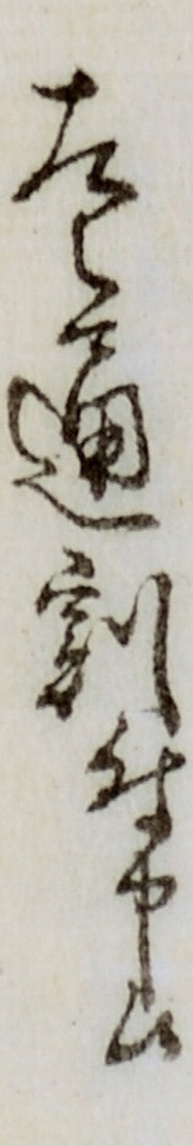左之通割付申候
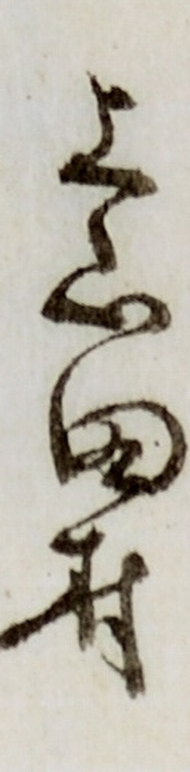上山田村
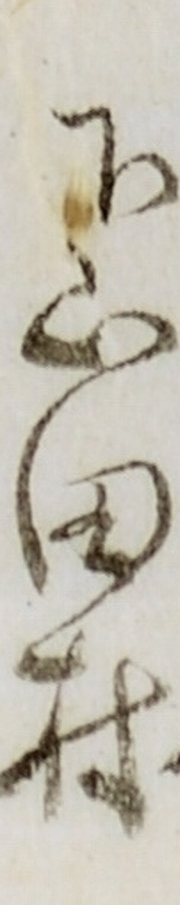下山田村
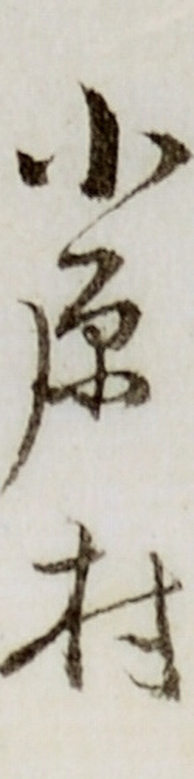小原村
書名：山林方諸事御用留
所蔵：伊那市立高遠町図書館・合同会社AMANE
